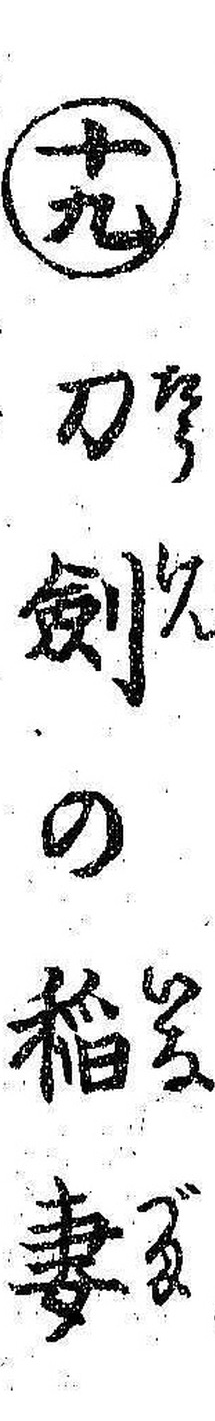十九刀剣の稲妻
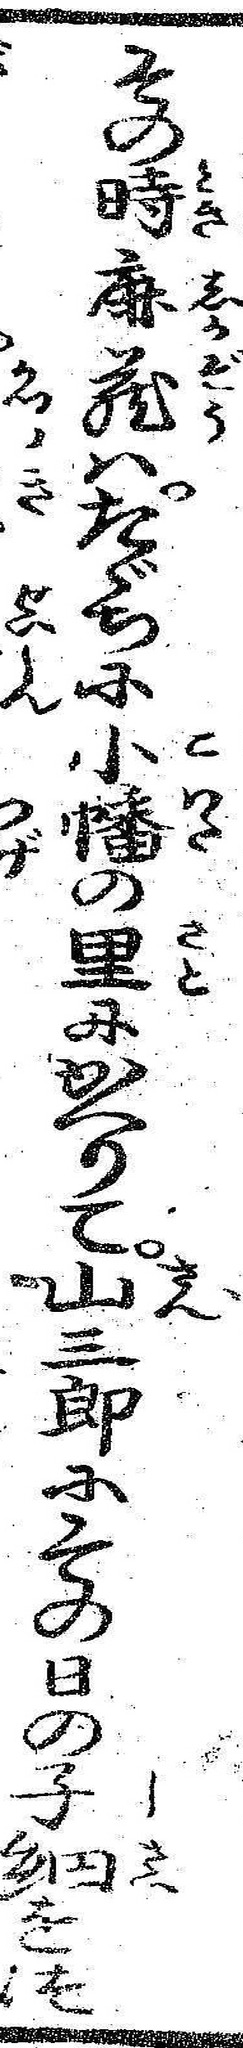その時鹿蔵は。たゞちに小幡の里にかへりて。山三郎にその日の子細をつ
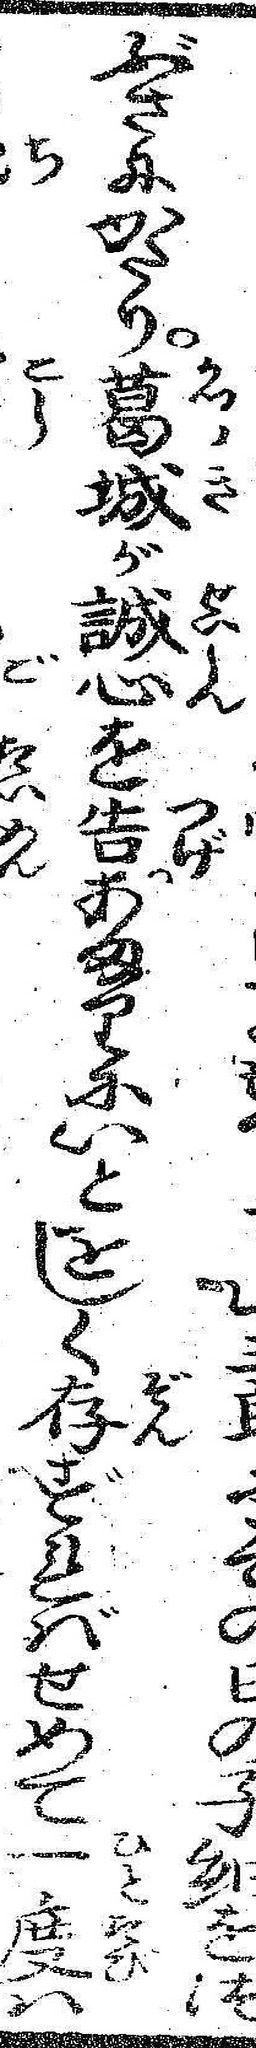ぶさにかたり。葛城が誠心を告。あまりにいとをしく存ずればせめて一度は
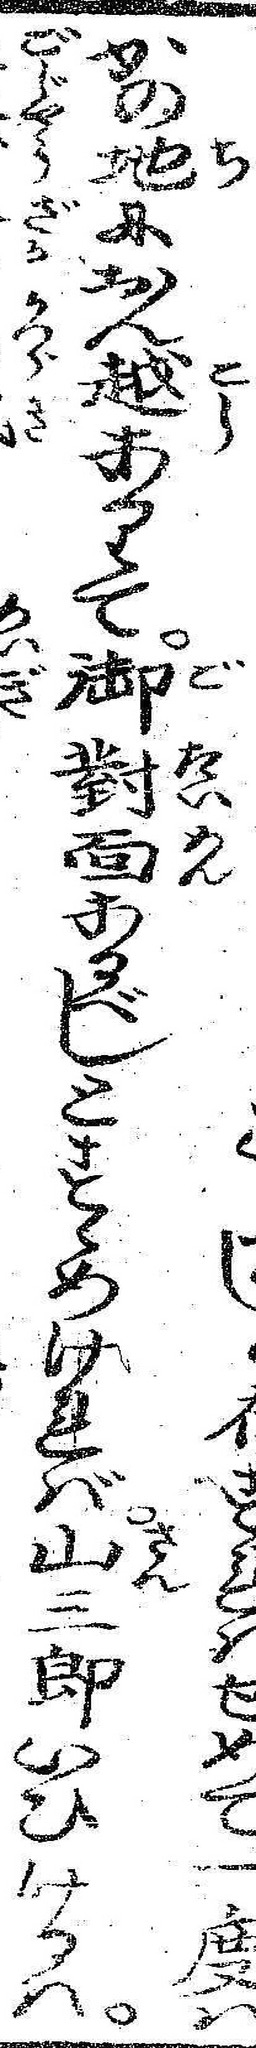かの地におん越ありて。御対面あるべしとすゝめければ。山三郎いひけるは。
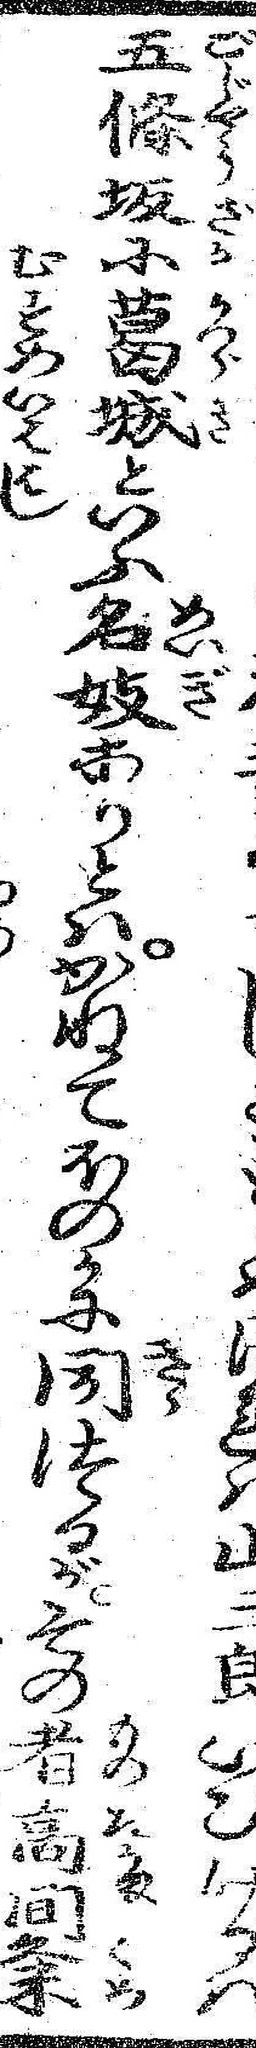五条坂に葛城といふ名妓ありとは。かねてほのかに聞つるが。その者高間粂
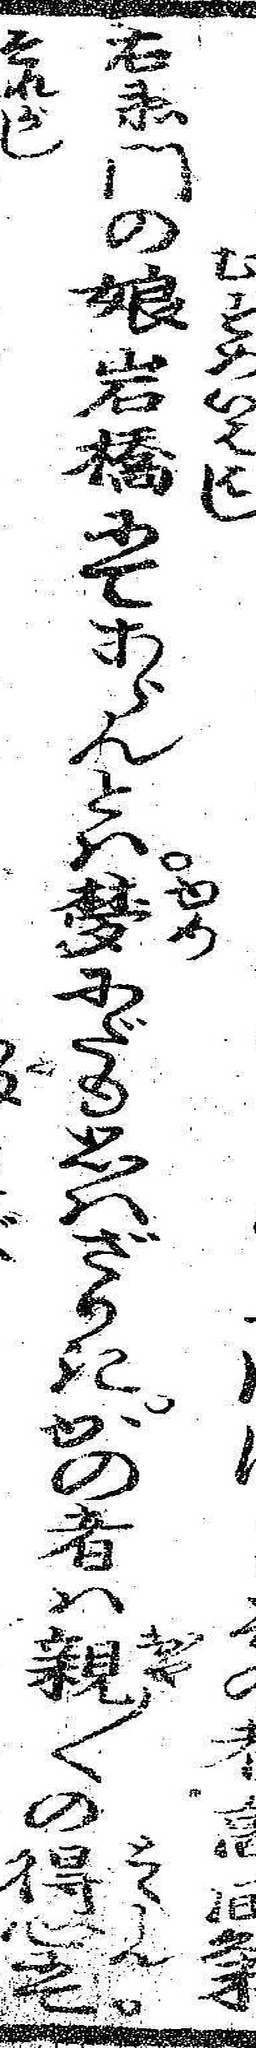右衛門の娘岩橋にてあらんとは。夢にだも思はざりき。かの者は親の得心にて。
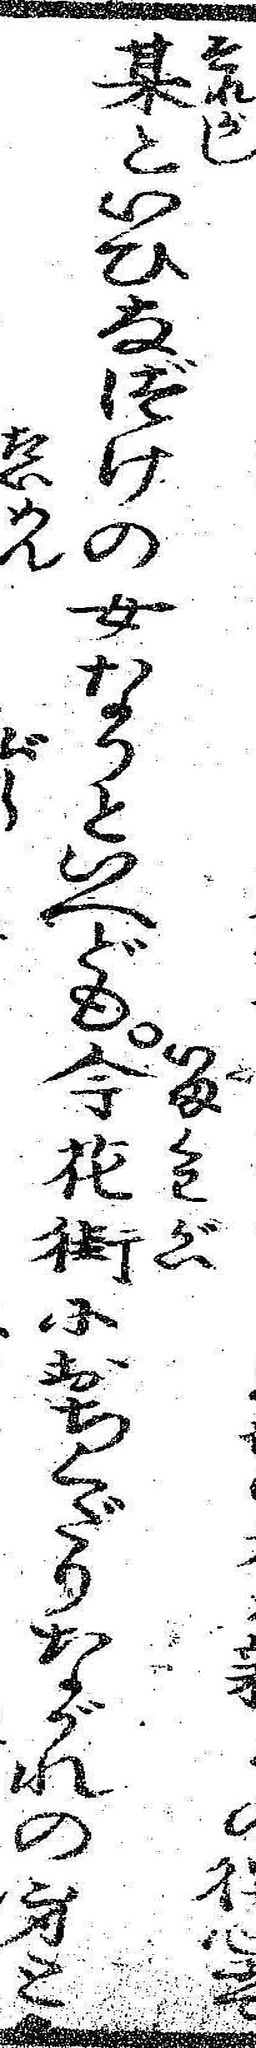某といひなづけの女なりといへども。今花街におちくだりながれの身と
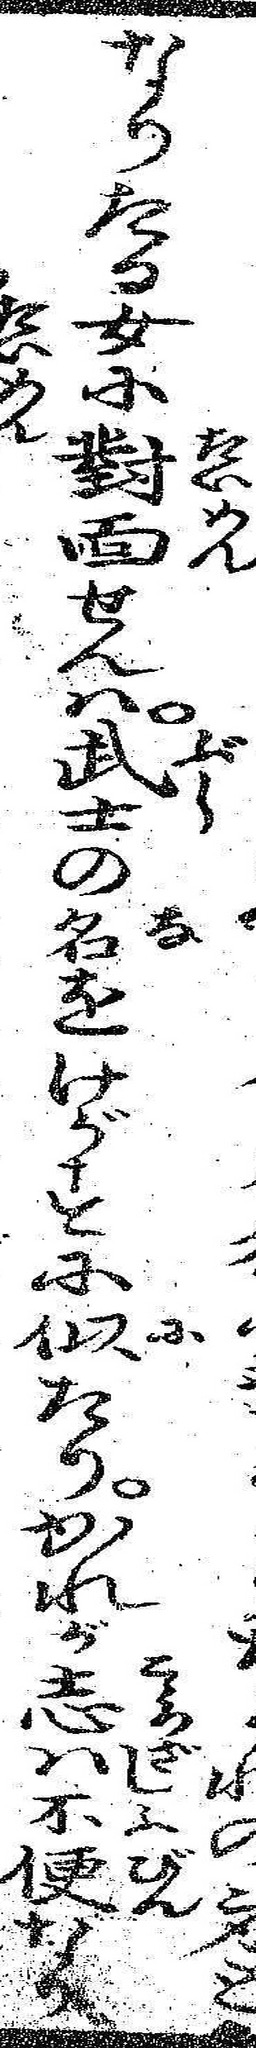なりたる女に対面せんは。武士の名をけがすに似たり。かれが志は不便なり
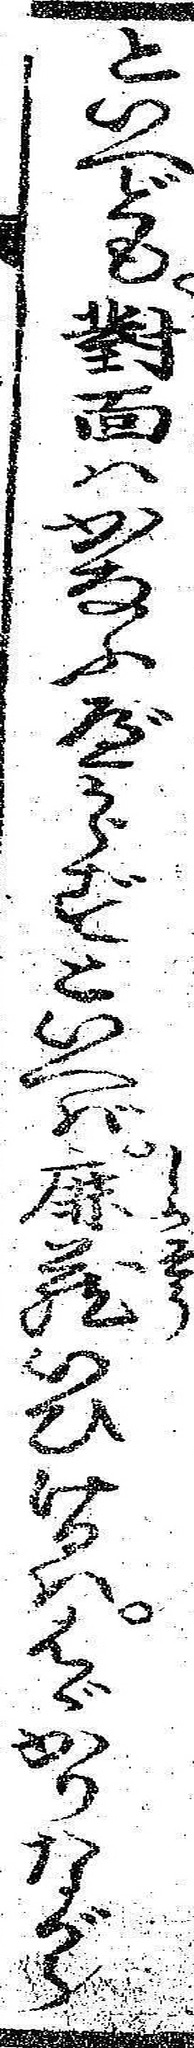といへども。対面はかなふべからずといへば。鹿蔵いひけるは。はゞりながら

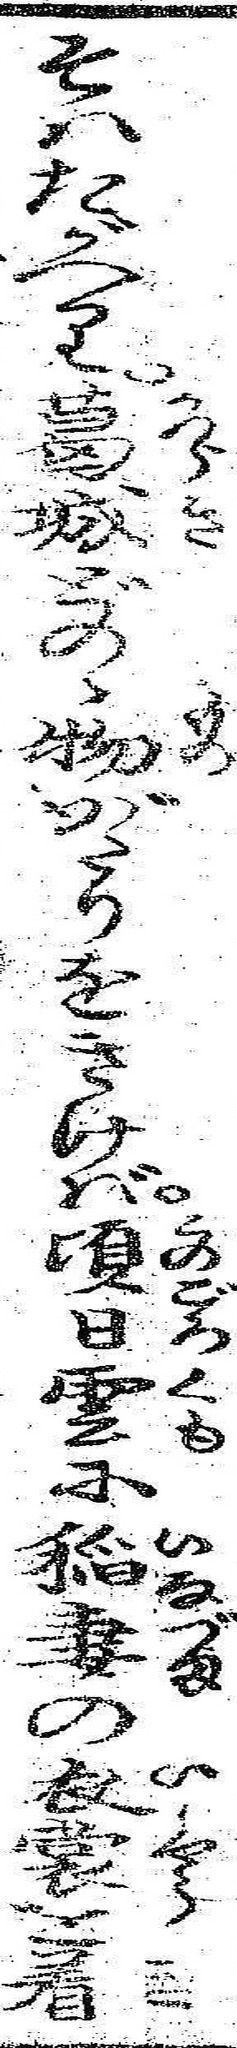そはたがへり。葛城どのゝ物がたりをきけば。頃日雲に稲妻の衣裳を着
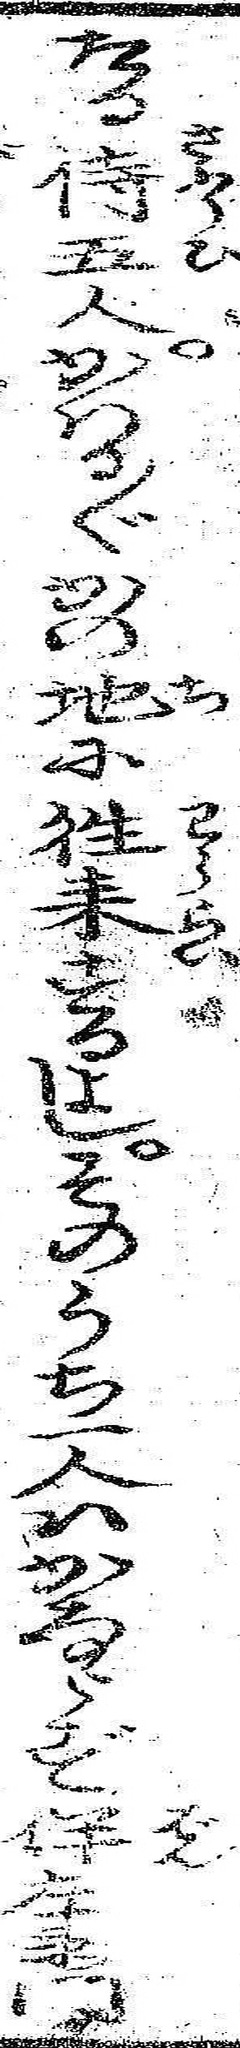たる侍五人。かはる〴〵かの地に往来するよし。そのうち一人はかならず伴左衛門
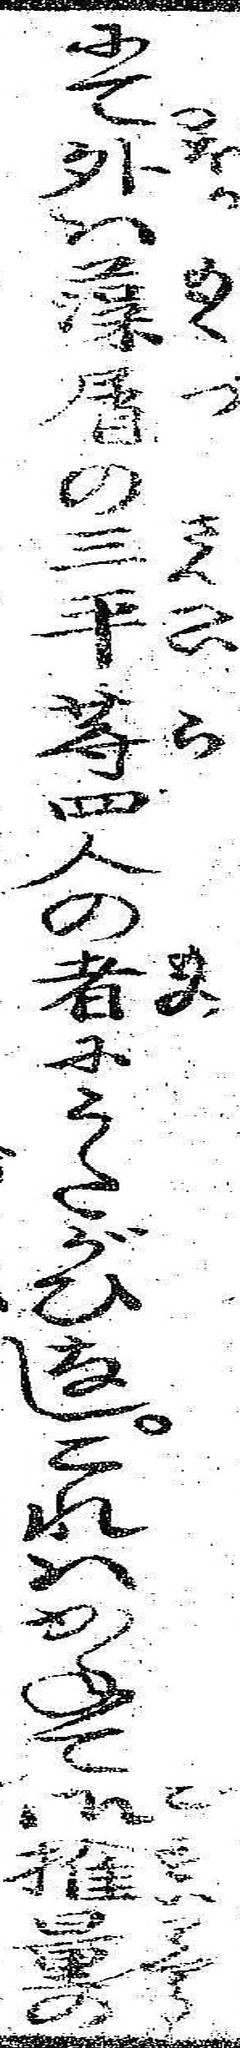にて。外は藻屑の三平等四人の者にうたがひなし。これはかねて御推量の
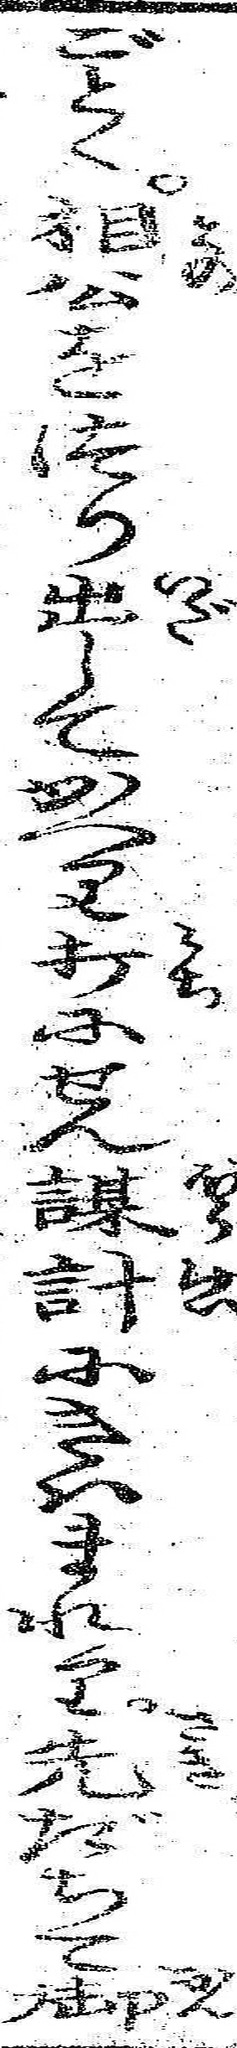ごとく。相公をつり出してかへり打にせん謀計にきはまれり。先だちて御
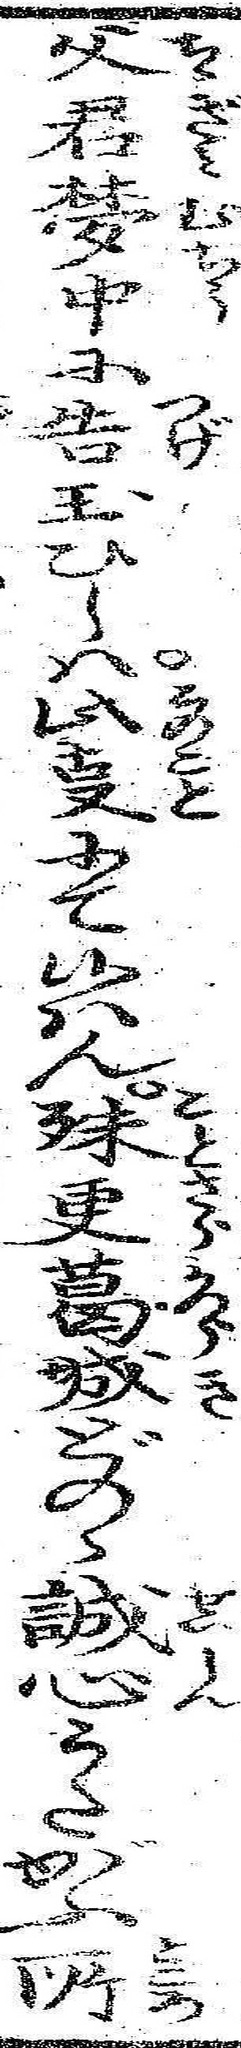父君夢中に告玉ひしは。此事にて候はん。殊更葛城どのゝ誠心うたがふ所
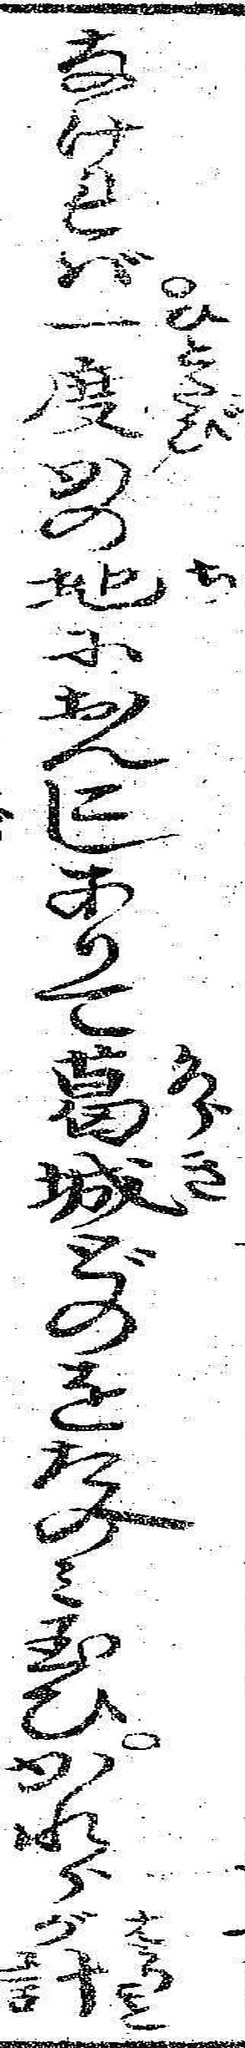なければ。一度かの地におんこしありて葛城どのをたのみ玉ひ。かれらが計
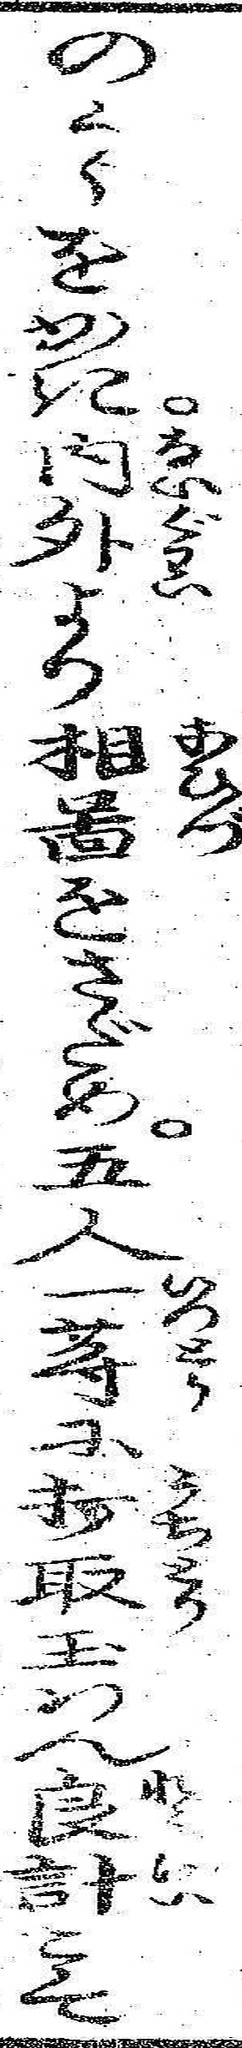のうらをかき。内外より相図をさだめ。五人一等に打取玉はん良計こそ
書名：昔話稲妻表紙
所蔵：国文学研究資料館
